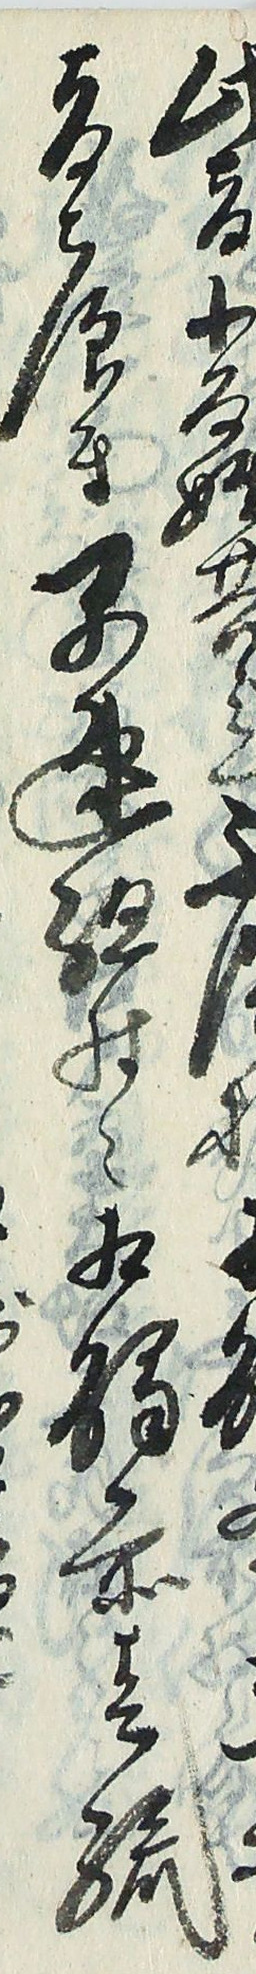旨被仰付早速組村々相触候所壱統
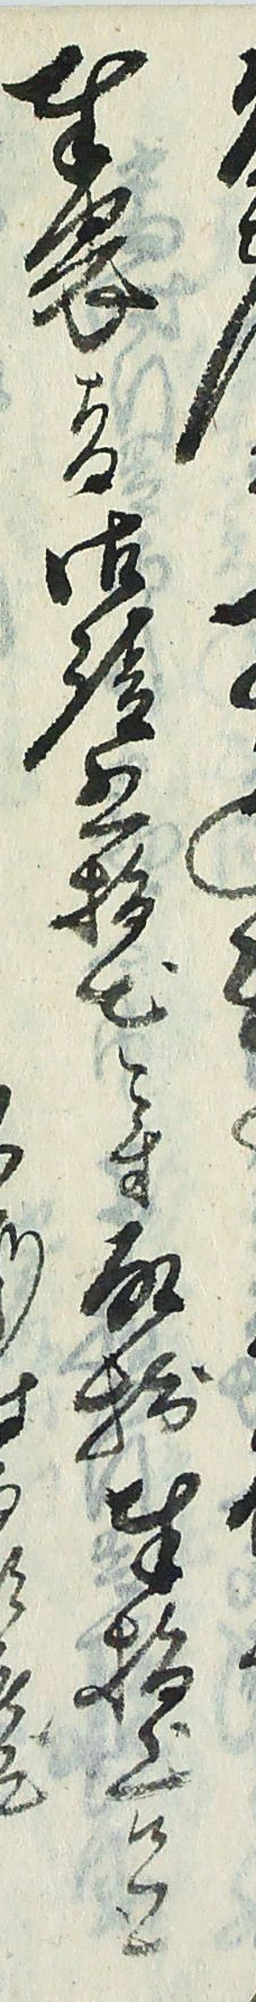奉畏旨御請書指出候に付取揃奉指上候以上
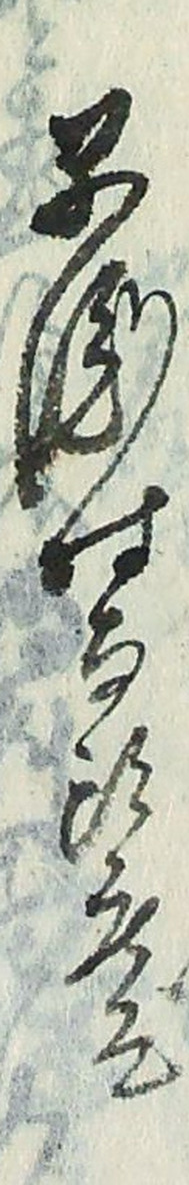早淵村与頭庄屋
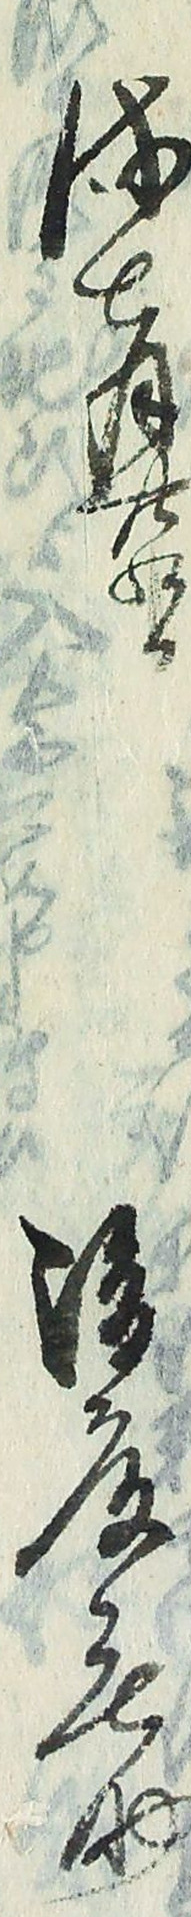戌七月廿九日後藤庄助
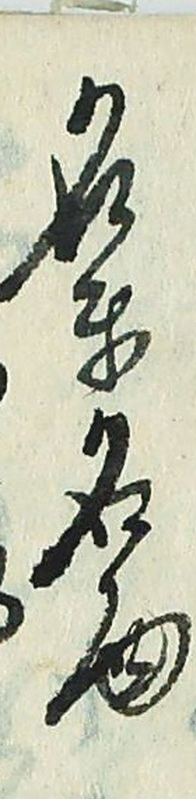名東名西
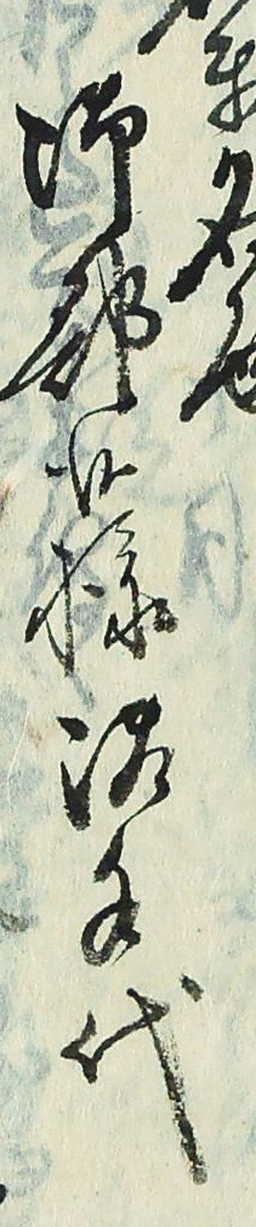御郡代様御手代
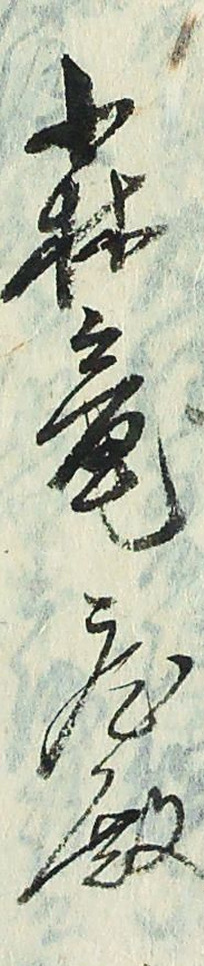小林竜蔵殿
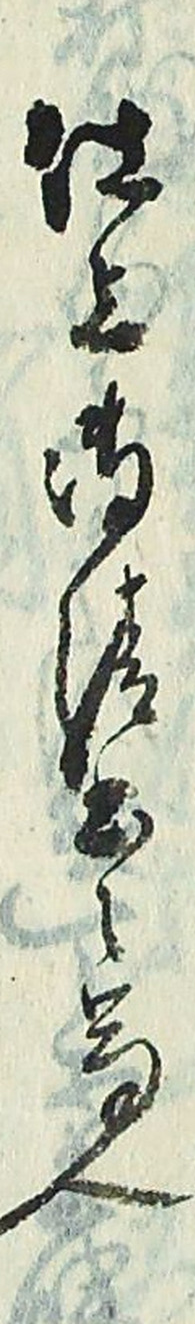仕上御請書之覚
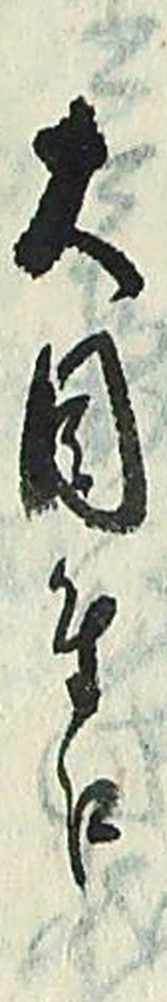大目付江
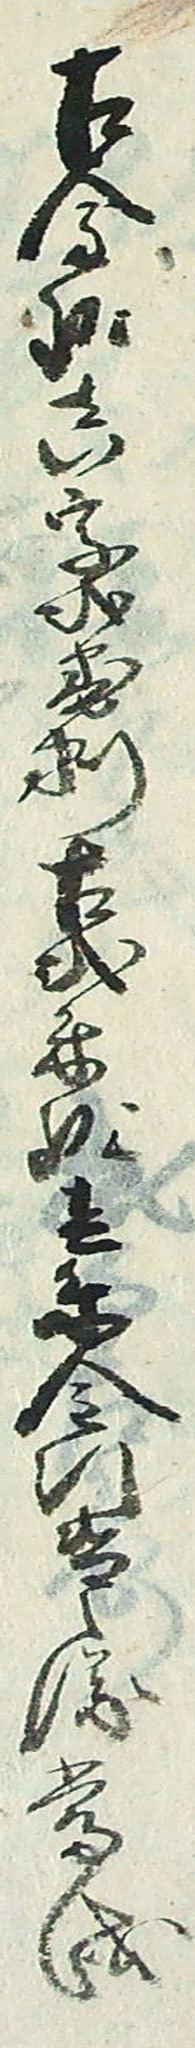古金銀真字弐歩判古弐朱銀壱朱金引替之儀当戌
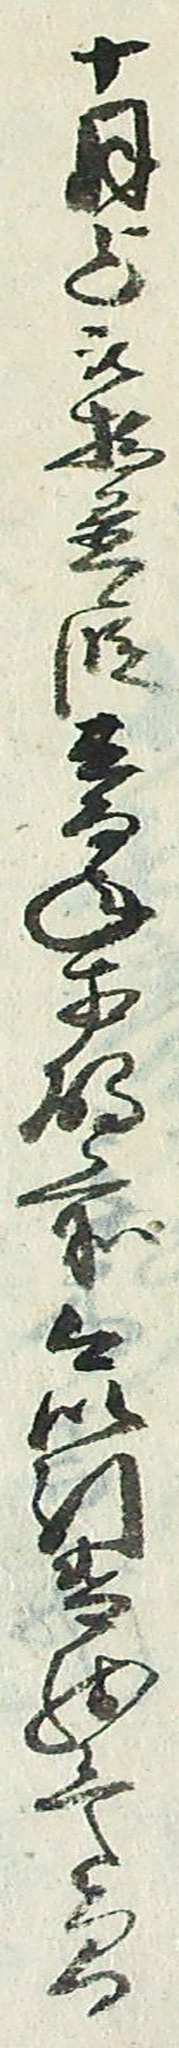十月迄被指置候段去酉年相触候所今以引替残有之候間
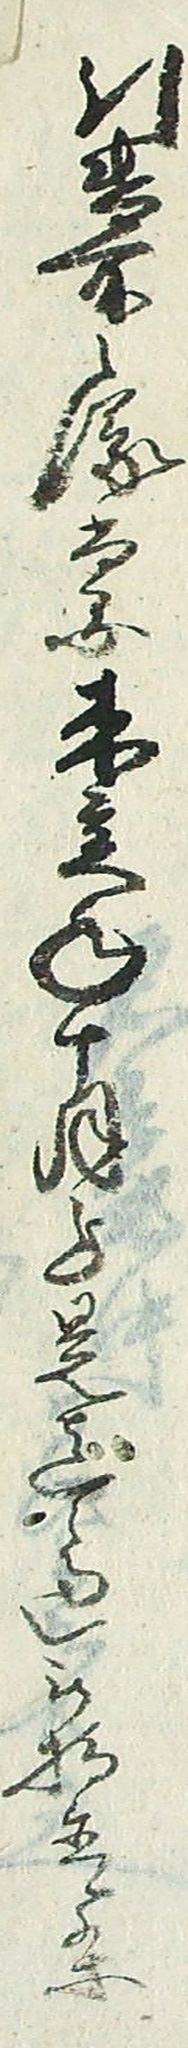引替所之儀尚亦来亥年十月迄是迄之通被指置候条

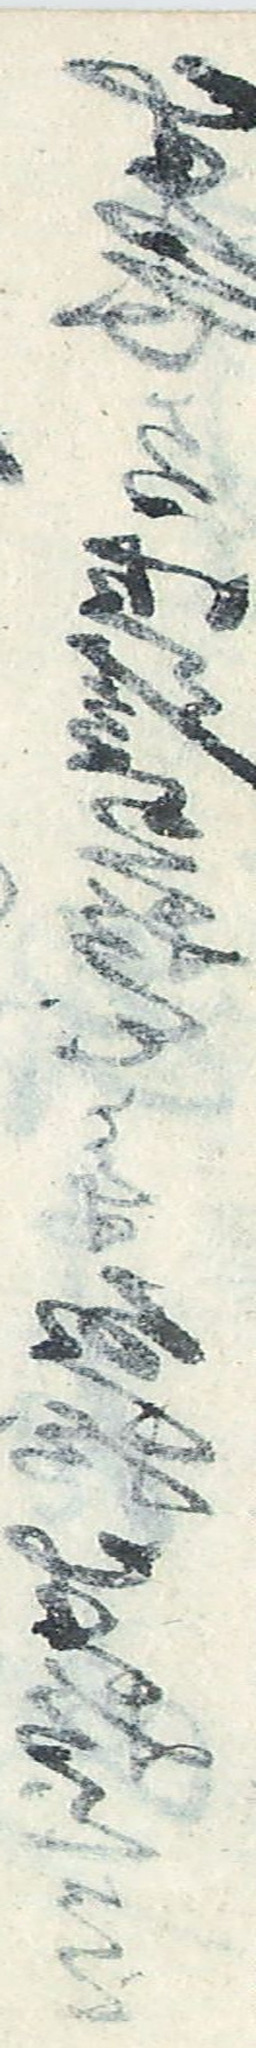戌十一月十五日
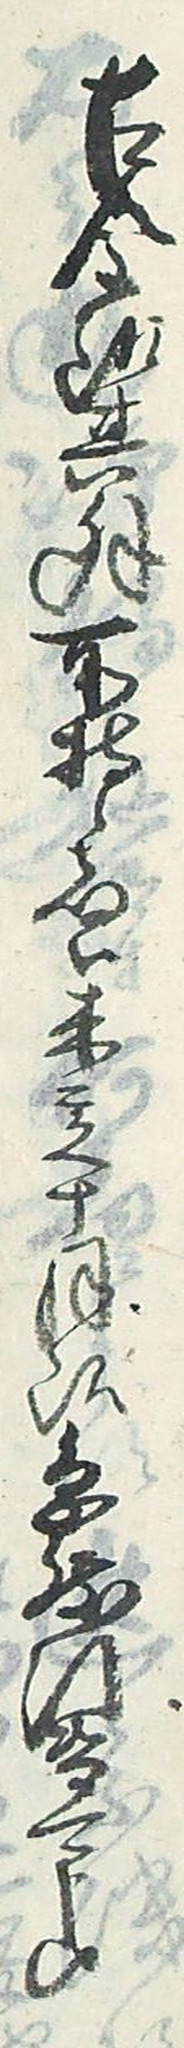古金銀其外所持之者は来亥年十月限急度引替可申候
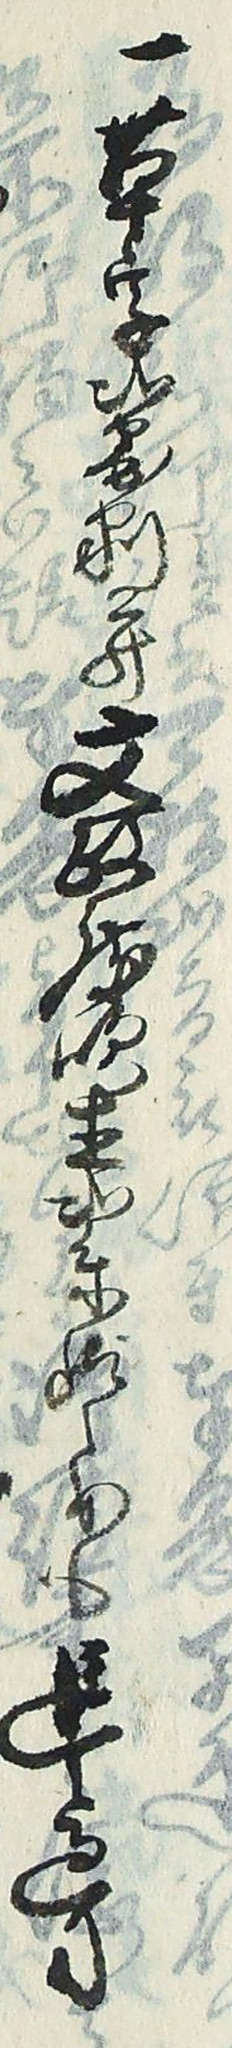一草字弐歩判幷文政度吹直弐朱銀之義も追而通用
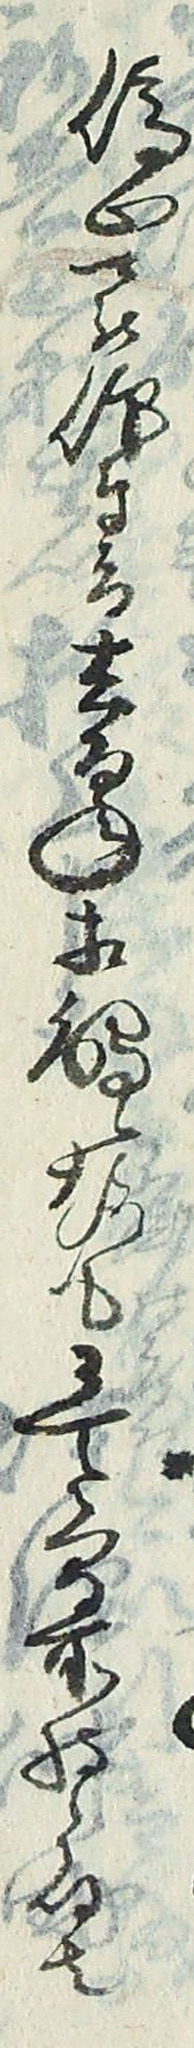停止可被仰付旨去酉年相触候趣も有之間所持之者は
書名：諸御用御□受書控
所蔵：鳴門教育大学 Naruto University of Education
